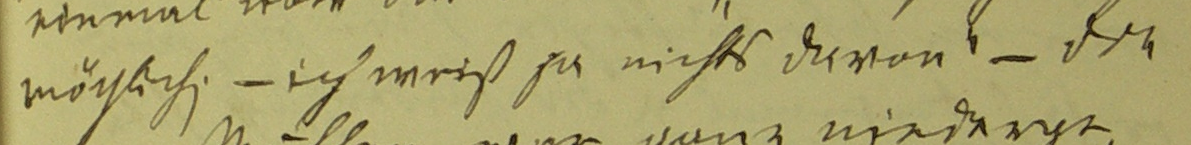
möglich , -ich weiß ja nichts davon - die
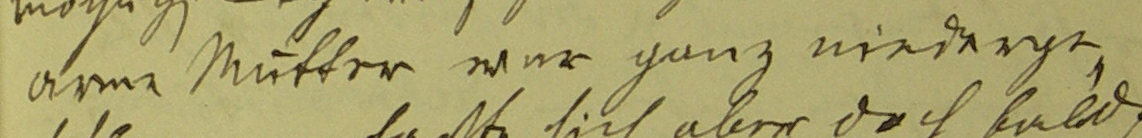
arme Mutter war ganz niederge¬
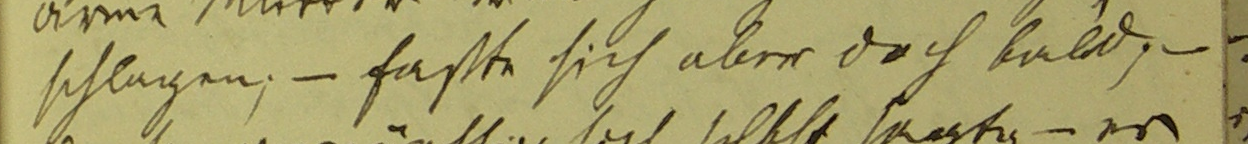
schlagen;- faßte sich aber doch bald –
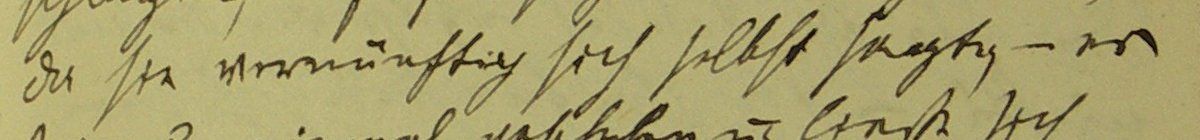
Da sie vernünftig sich selbst sagte,-es
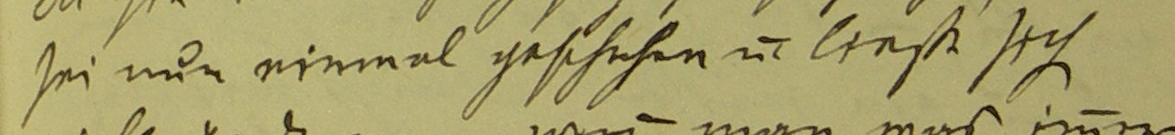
sei nun einmal geschehen und ließe sich
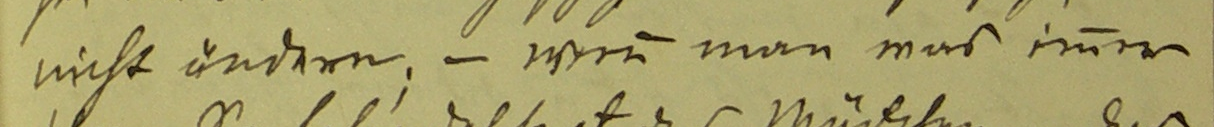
nicht ändern,-wenn man was immer
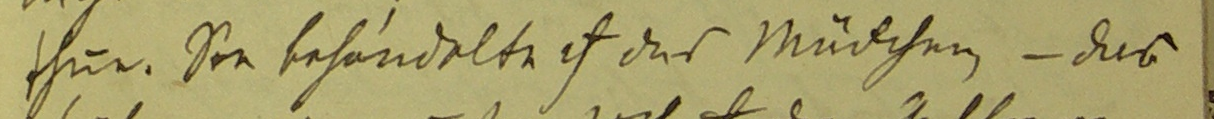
thue. Sie behandelte auch das Mädchen,- das
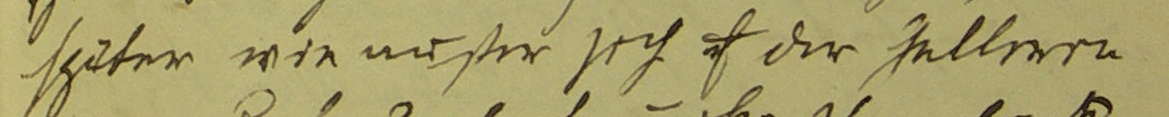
später wie außer sich auf der Gallerie
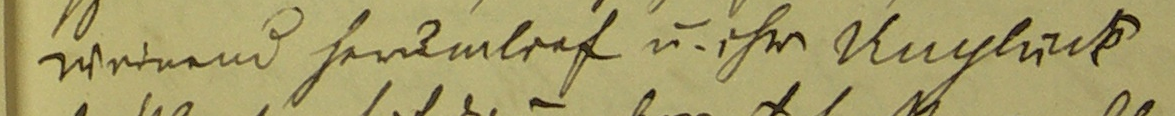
weinend herumlief und ihr Unglück
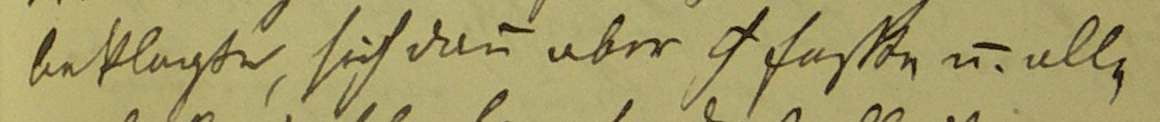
beklagte , sich dann aber auch faßte und all¬
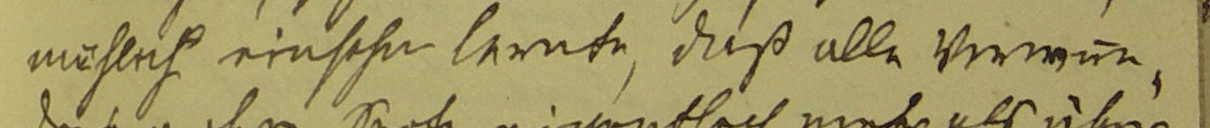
mählich einsehen lernte , daß alle Verwun¬
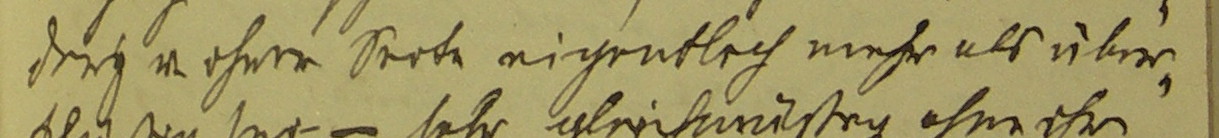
derung von ihrer Seite eigentlich mehr als über¬
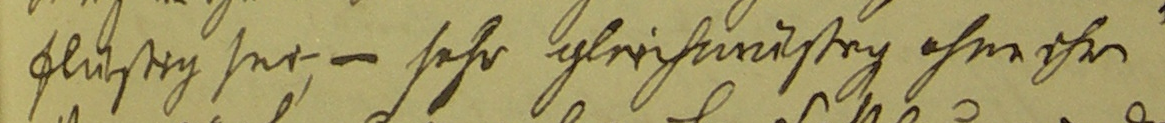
flüssig sei,- sehr gleichmäßig ohne ihr
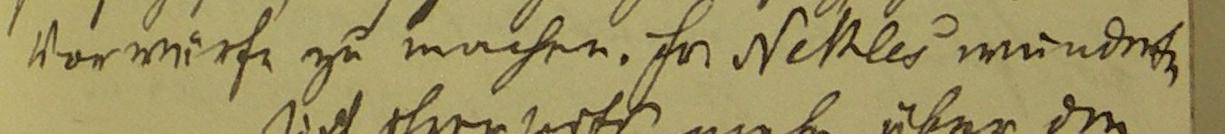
Vorwürfe. Fr. Nekles wunderte
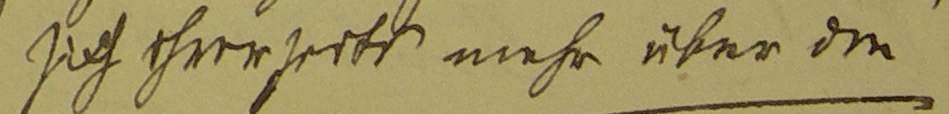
sich ihrerseits mehr über den
